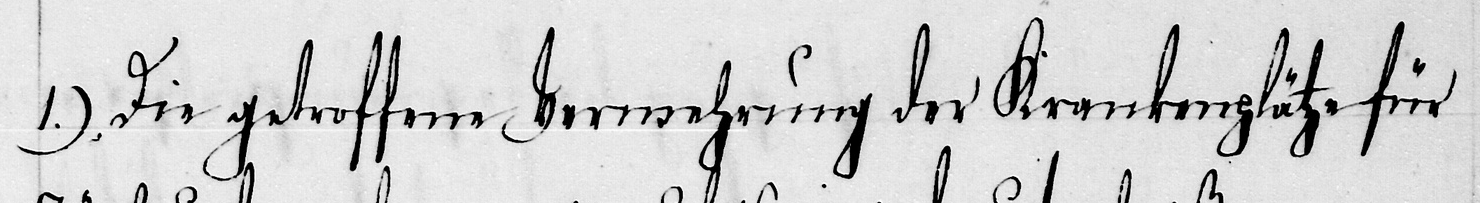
1.) Die getroffene Vermehrung der Krankenplätze für
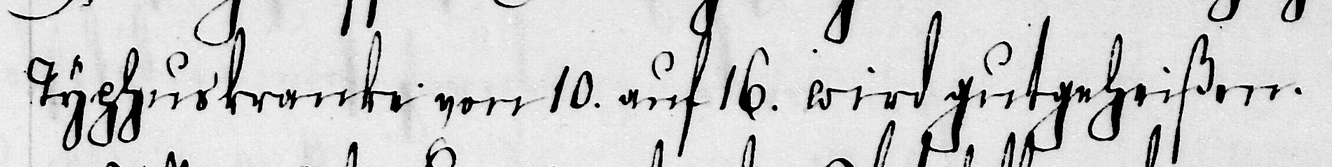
Typhuskranke von 10. auf 16. wird gutgeheißen.
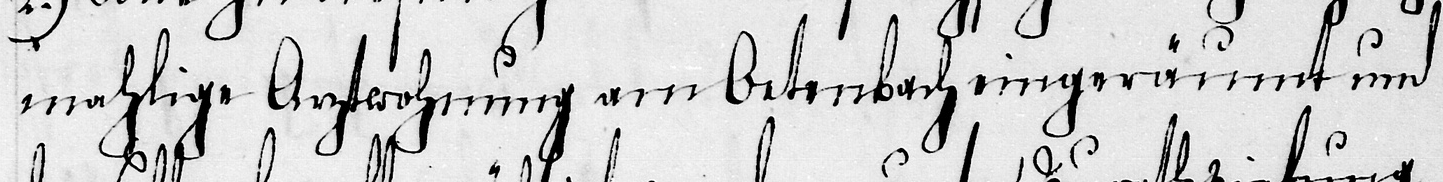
mahlige Arztwohnung am Oetenbach eingeräumt und
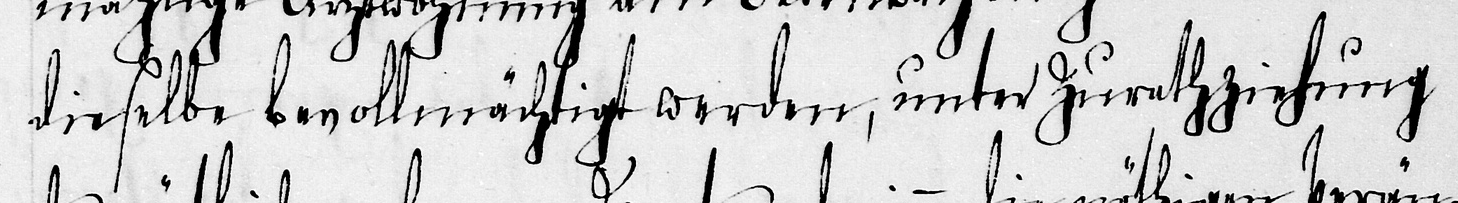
dieselbe bevollmächtigt werden, unter Zurathziehung
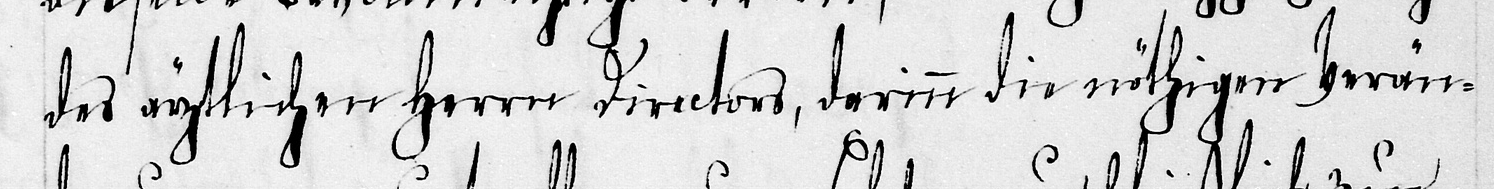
des ärztlichen Herrn Directors, darinn die nöthigen Verän¬
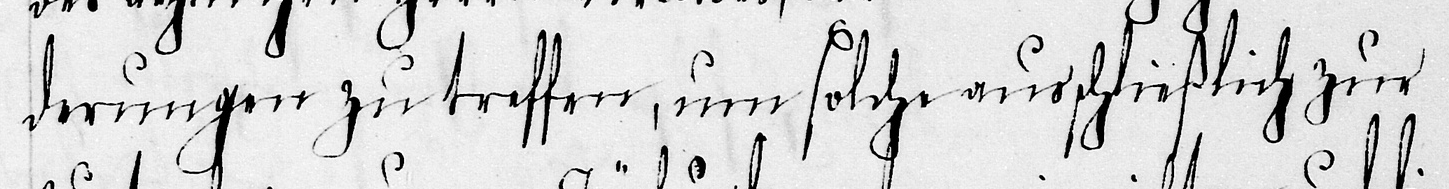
derungen zu treffen, um solche ausschließlich zur
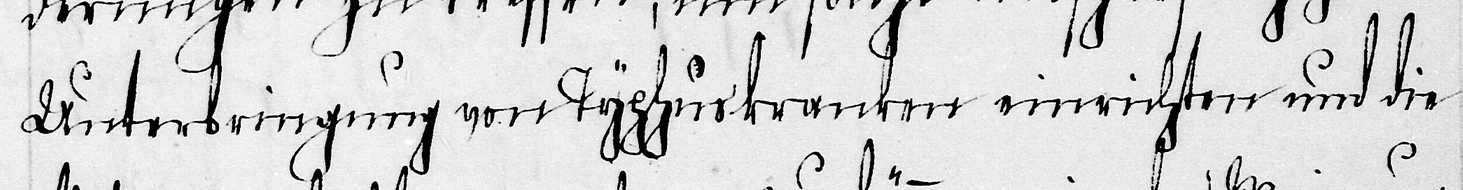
Unterbringung von Typhuskranken einrichten und die
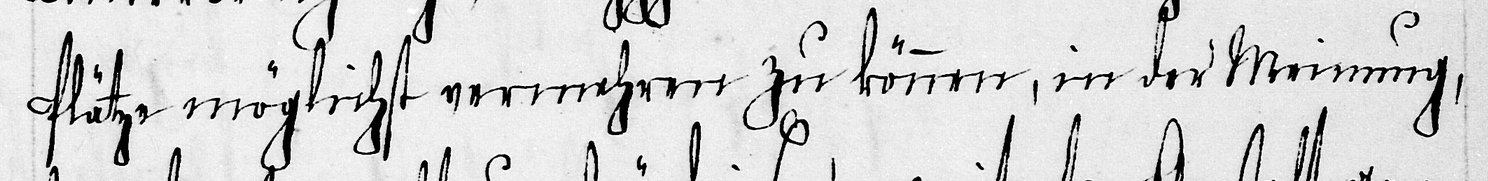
Plätze möglichst vermehren zu können, in der Meinung,
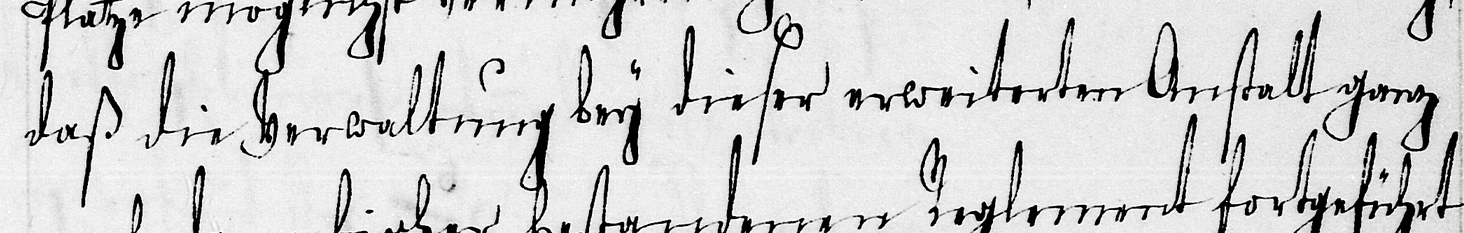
daß die Verwaltung bey dieser erweiterten Anstalt ganz
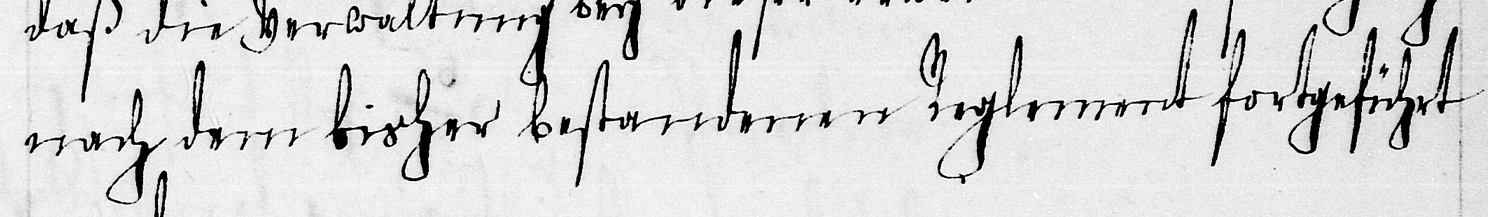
nach dem bisher bestandenen Reglement fortgeführt
